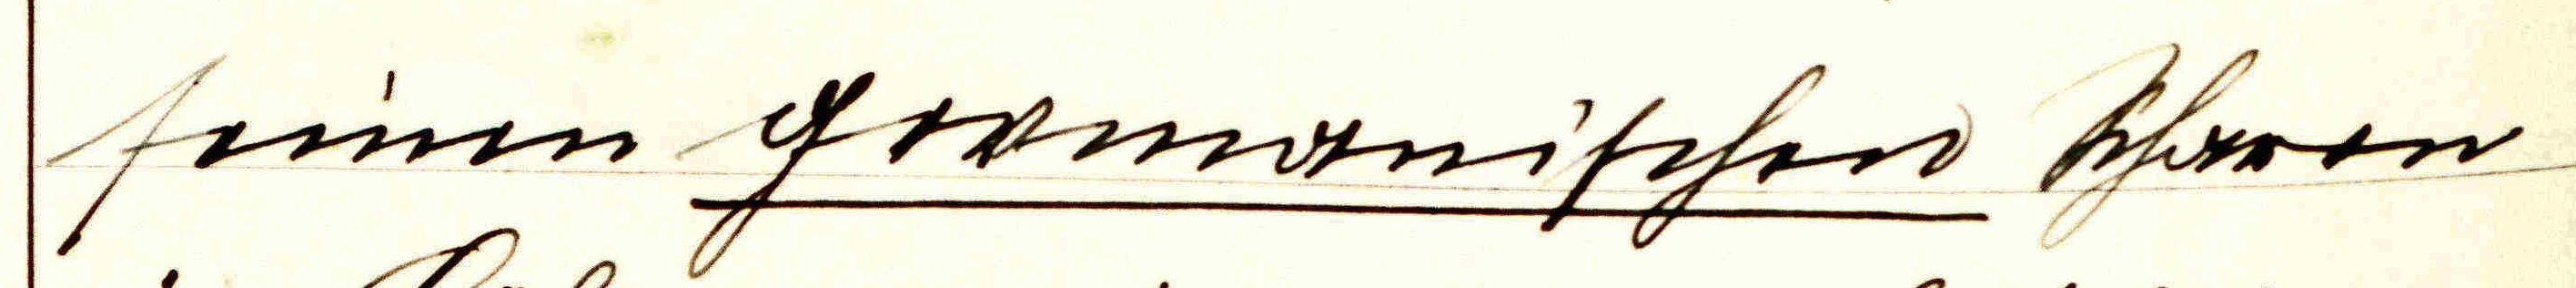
seinen germanischen Scharen
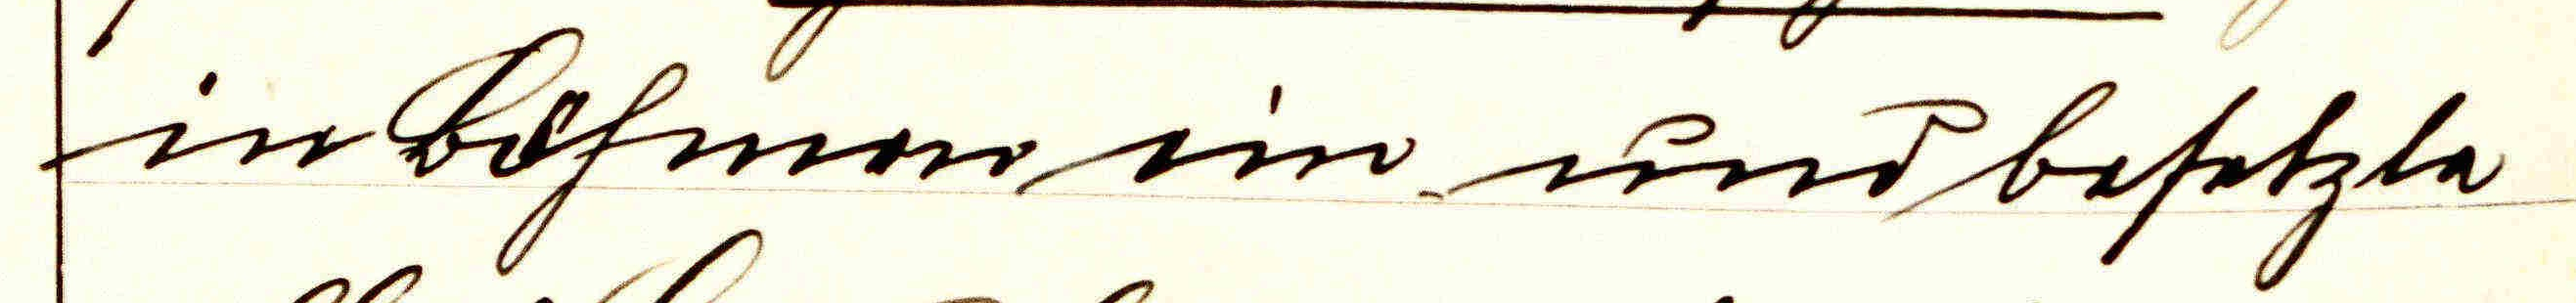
in Böhmen ein und besetzte
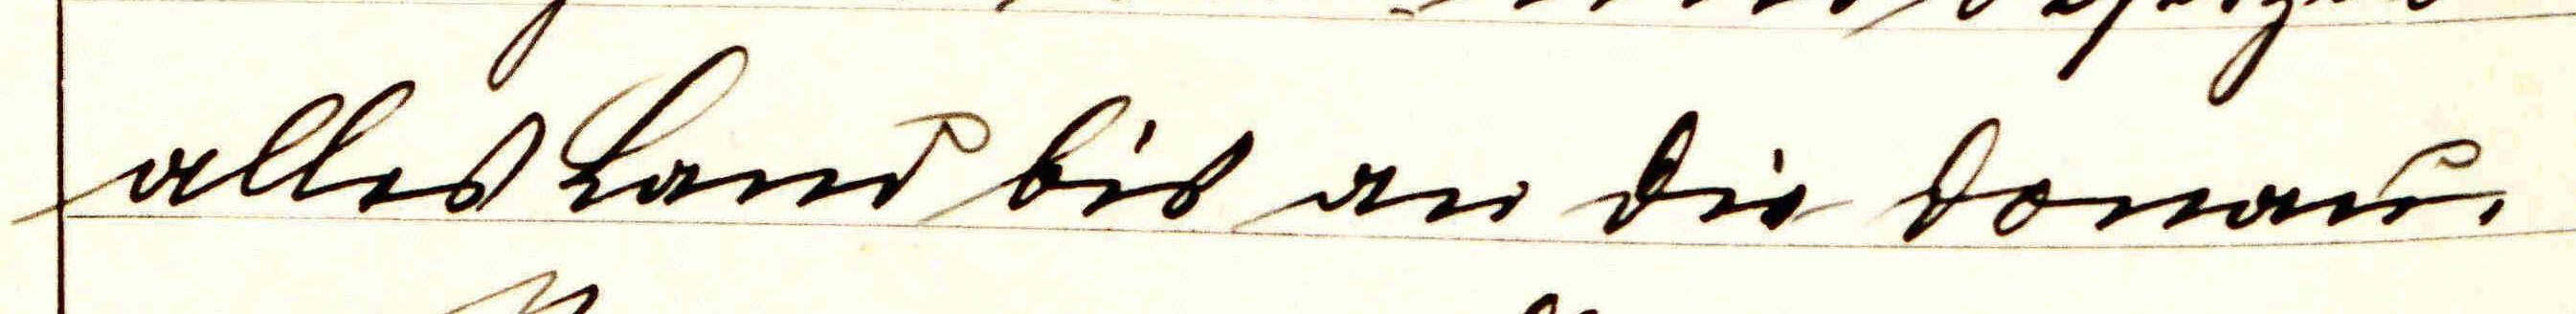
alles Land bis an die Donau.
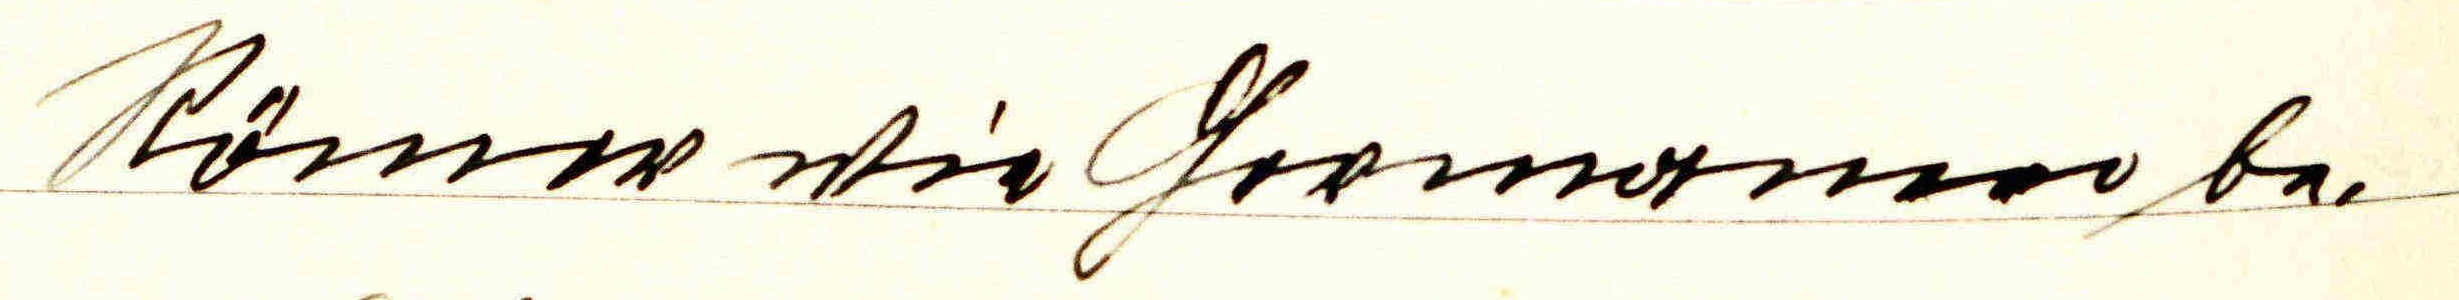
Römer wie Germanen be-
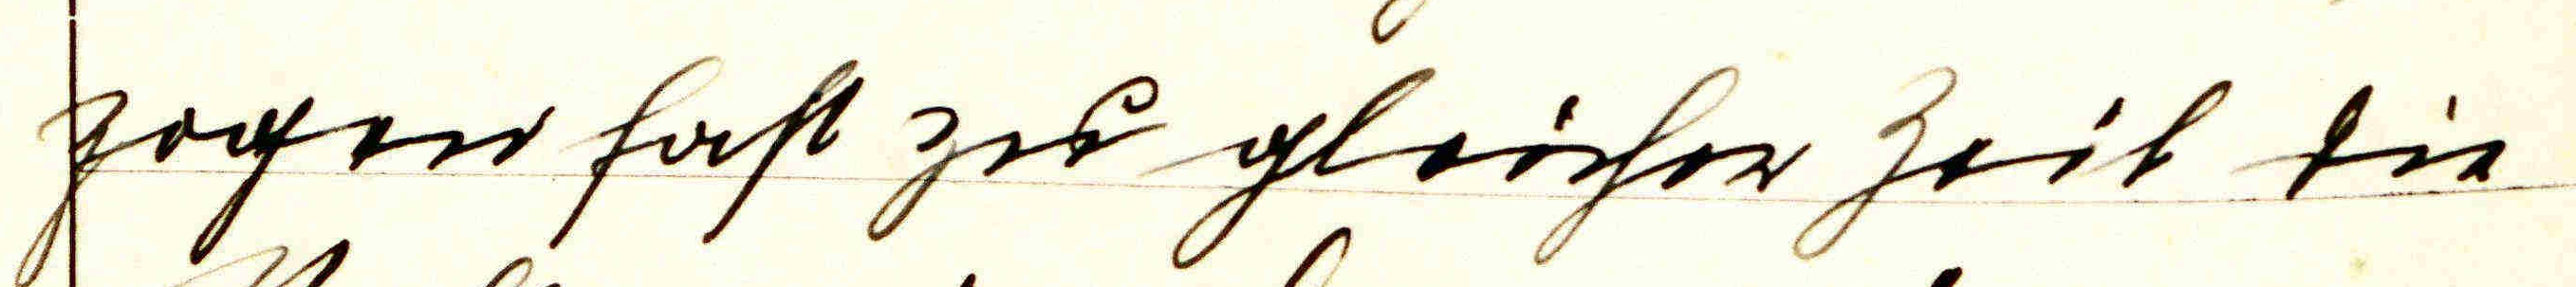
zogen fast zu gleicher Zeit die
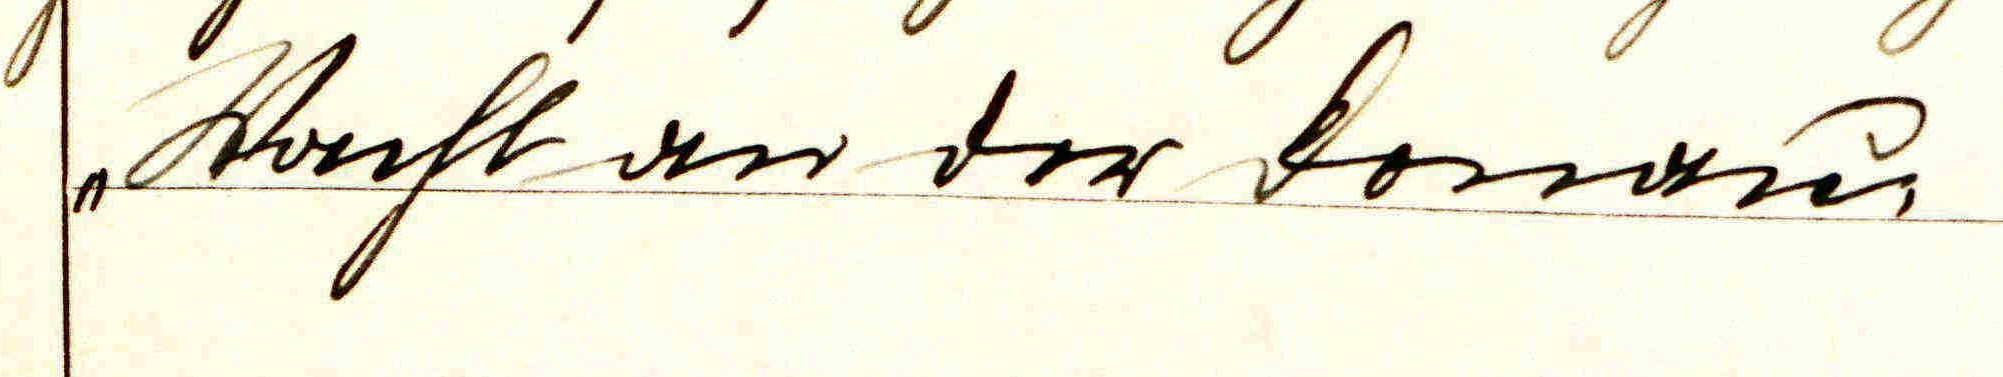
„Macht an der Donau“
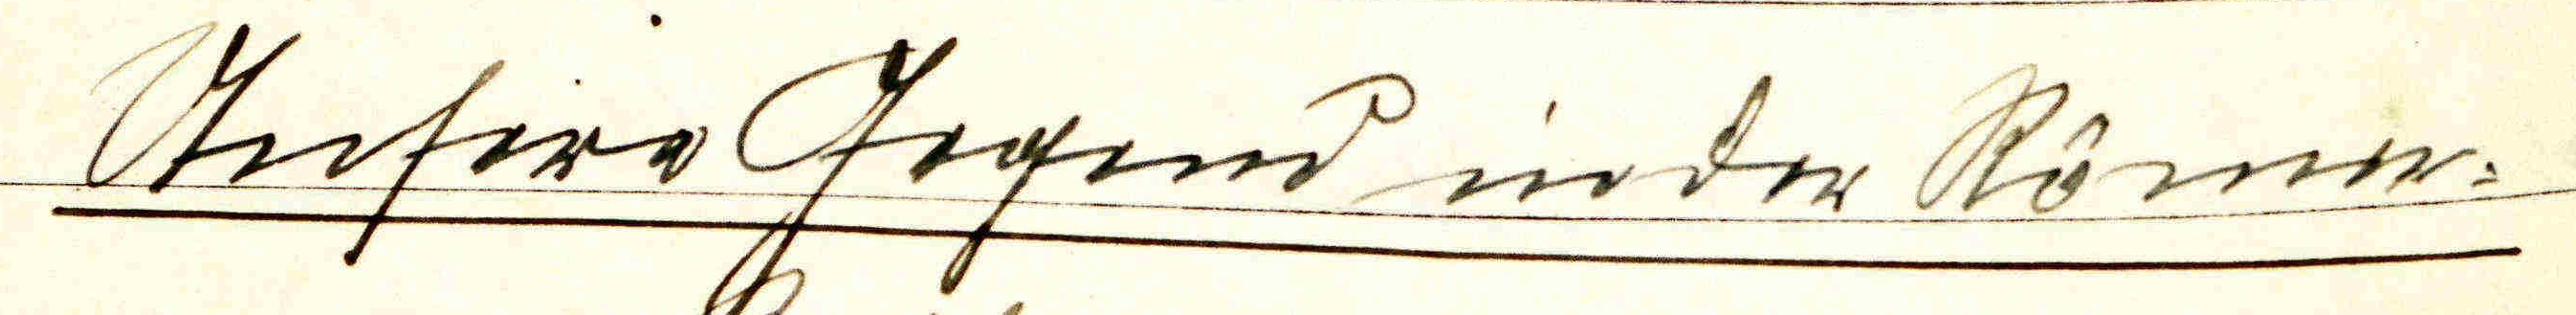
Unsere Gegend in der Römer-
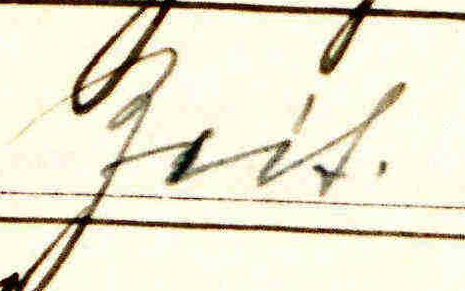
zeit.
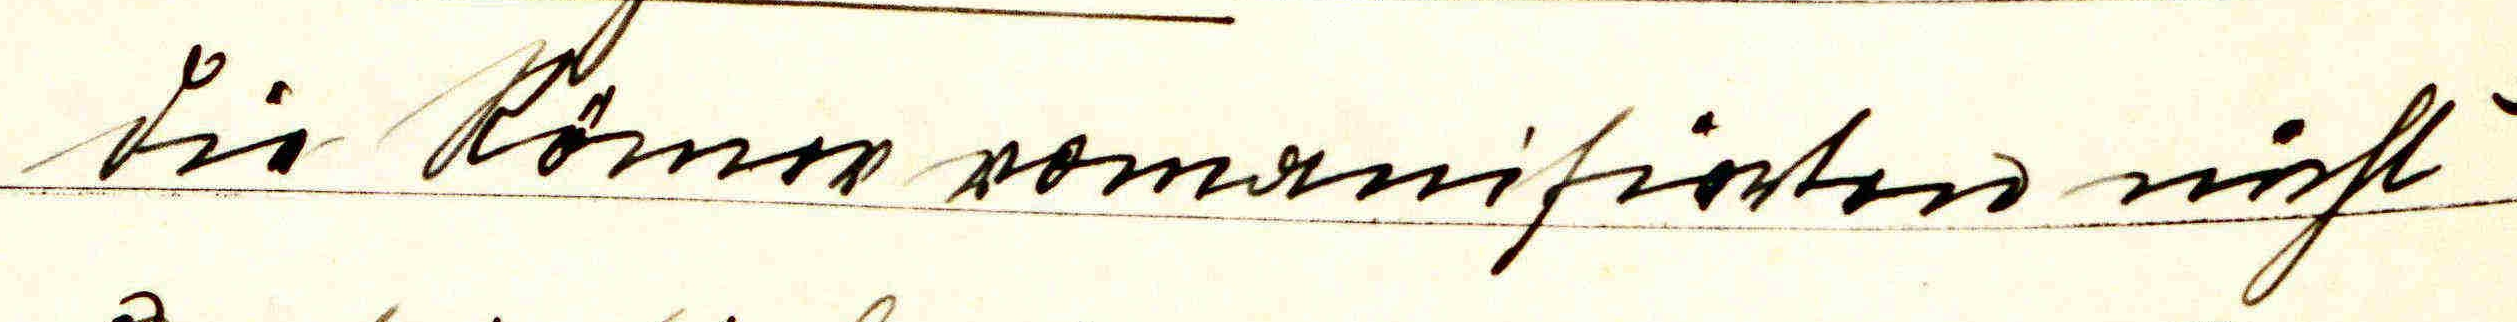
Die Römer romanisierten nicht
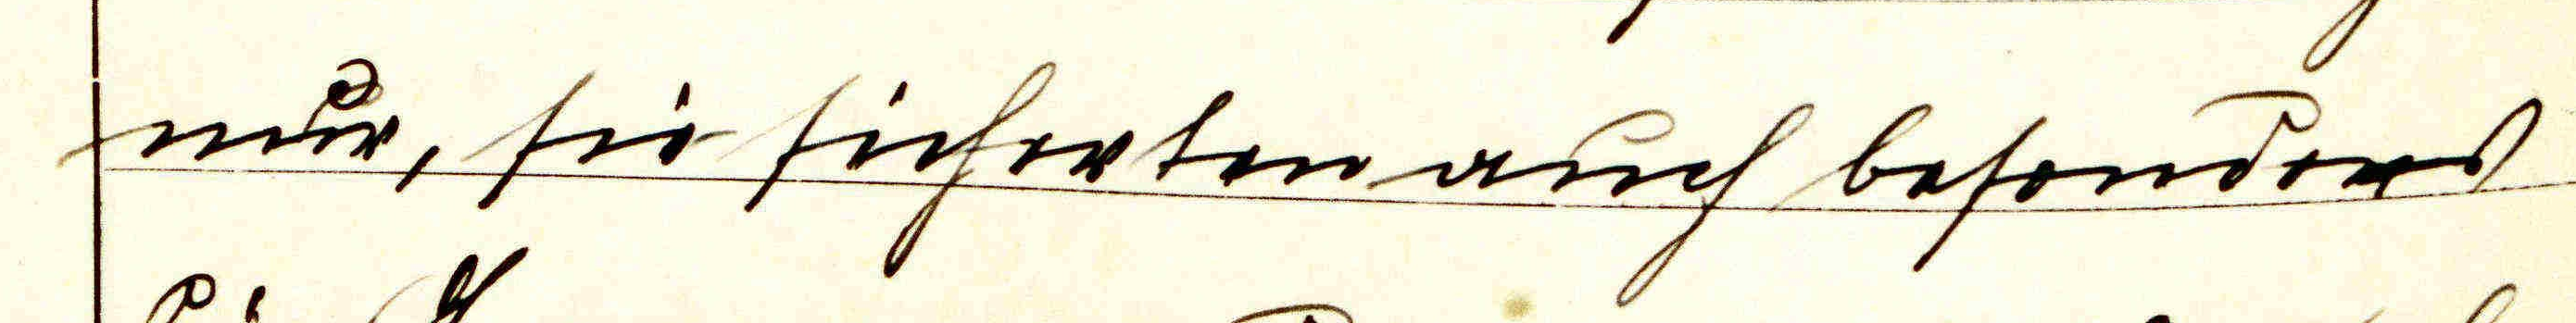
nur, die sicherten auch besonders
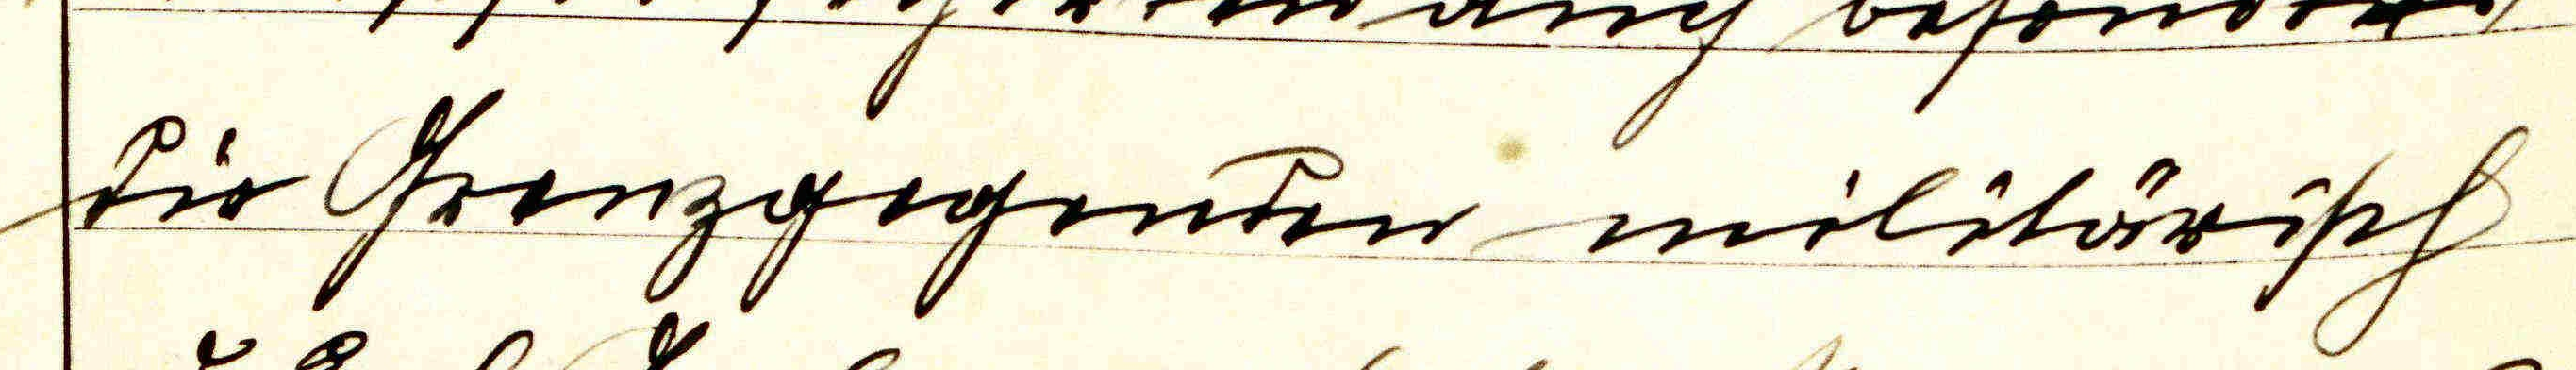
die Grenzgegenden militärisch
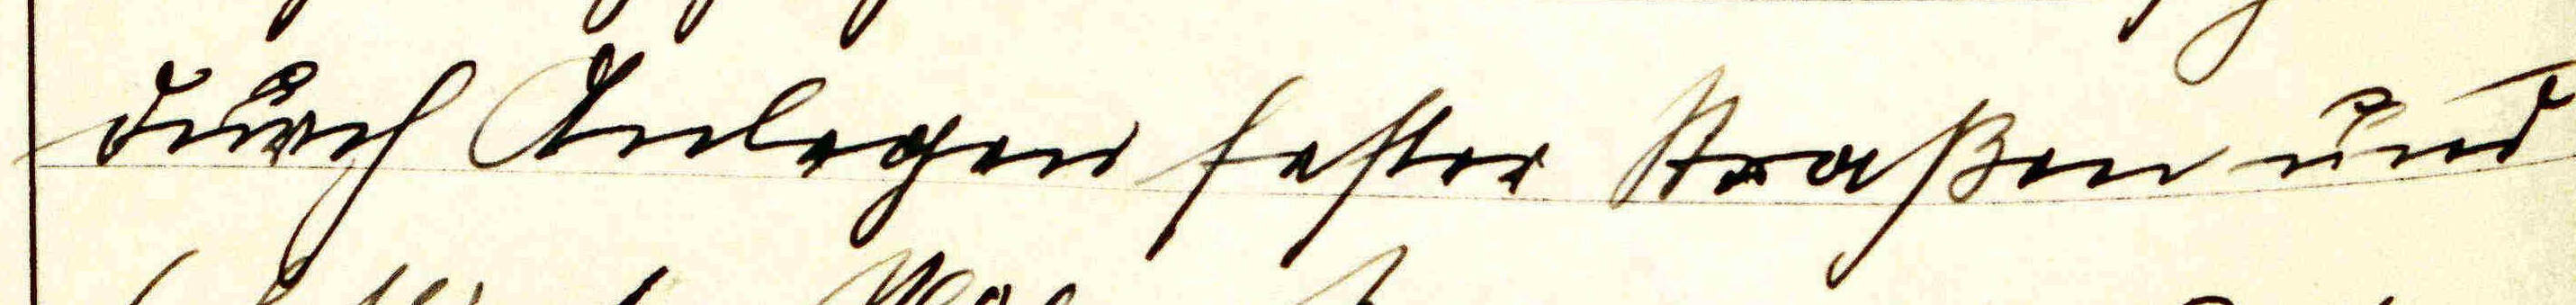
durch Anlegen fester Straßen und
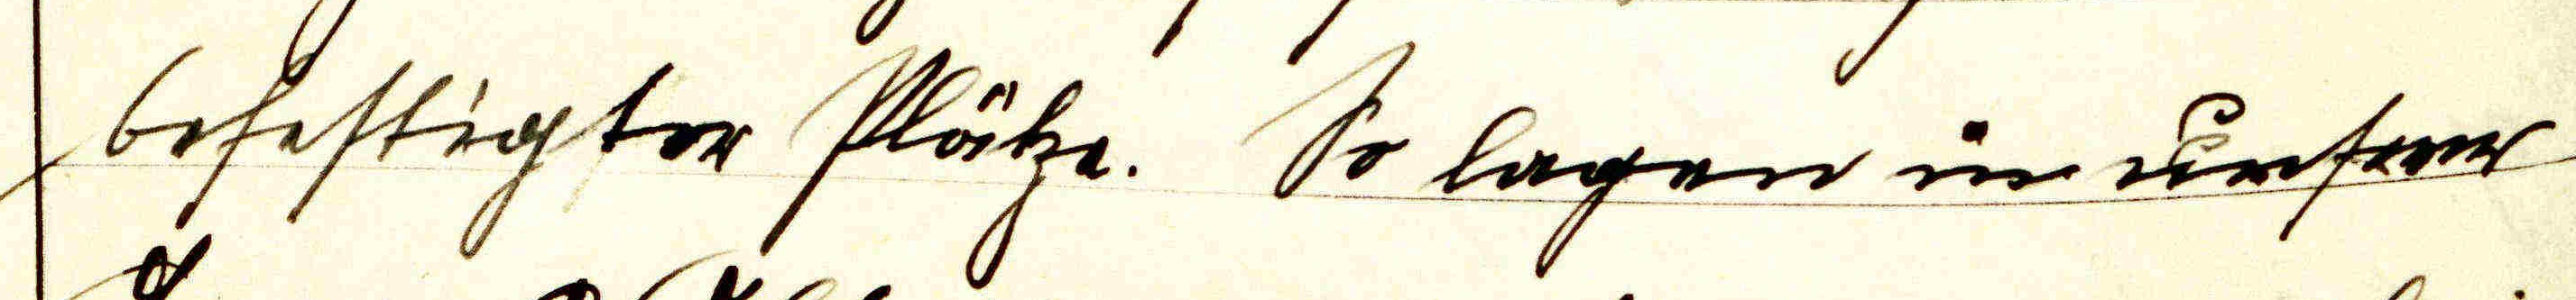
befestigter Plätze. So lagen in unserer
